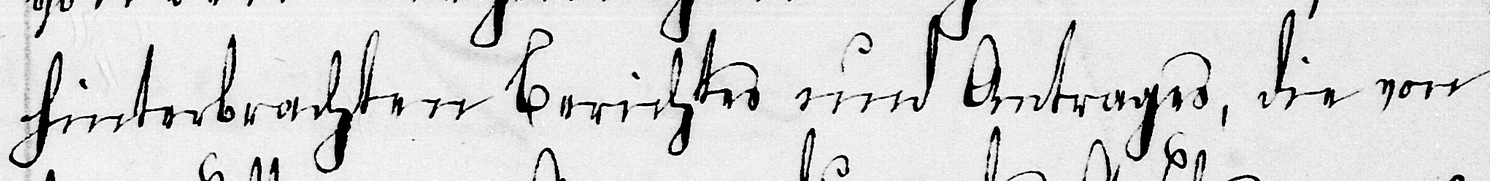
hinterbrachten Berichtes und Antrages, die von
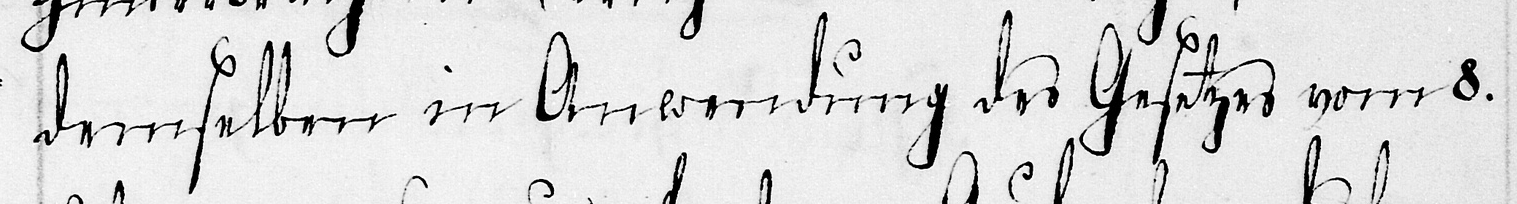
demselben in Anwendung des Gesetzes vom 8.
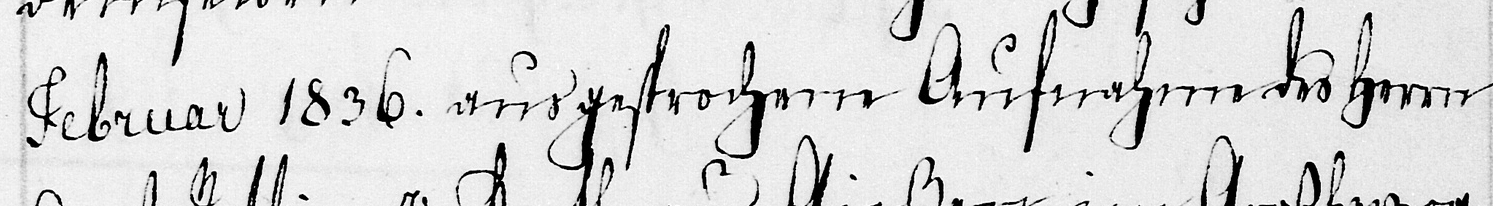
Februar 1836. ausgesprochene Aufnahme des Herrn
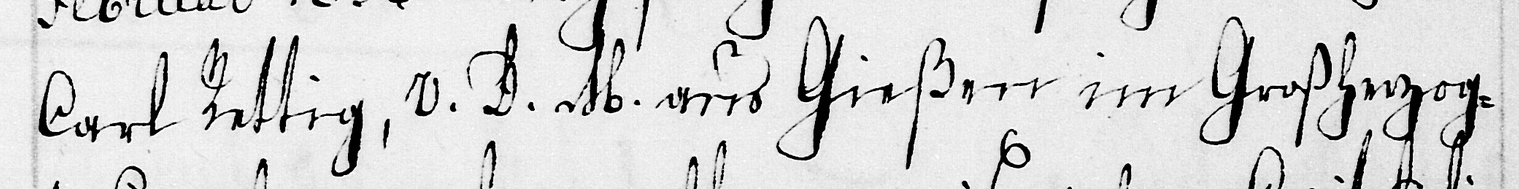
Carl Rettig, V. D. M. aus Gießen im Großherzog¬
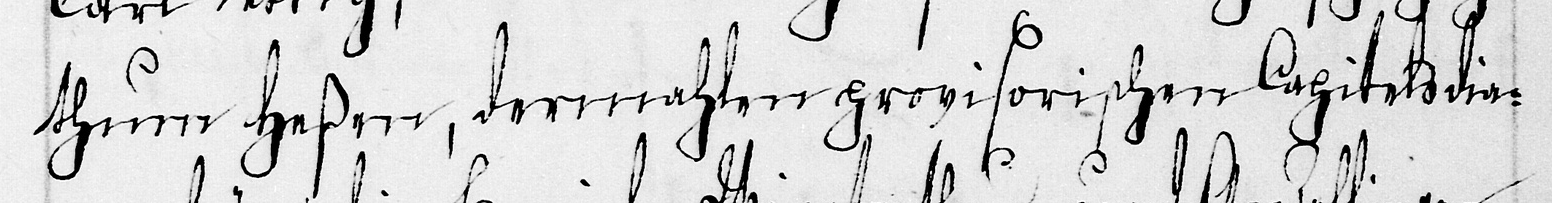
thum Heßen, dermahlen provisorischen Capitelsdia¬
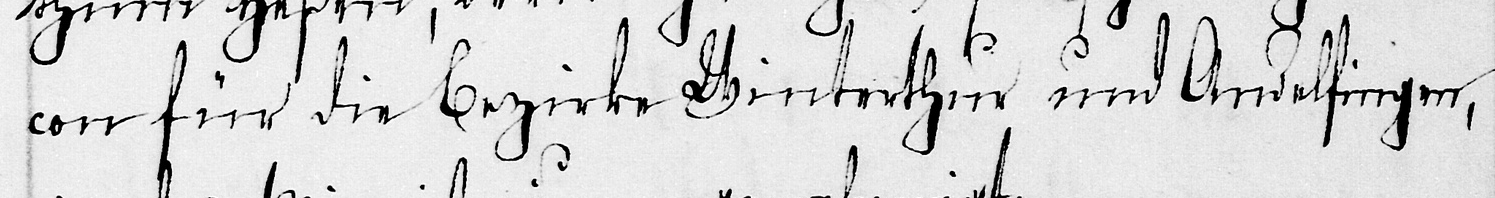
con für die Bezirke Winterthur und Andelfingen,
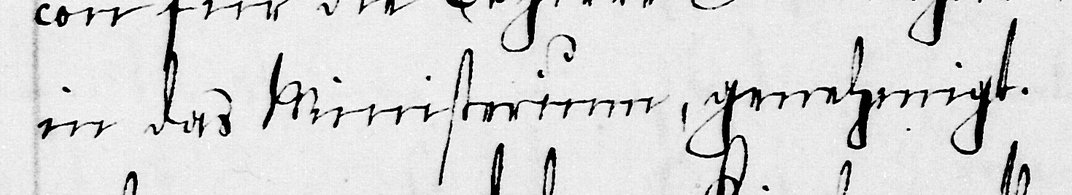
in das Ministerium, genehmigt.
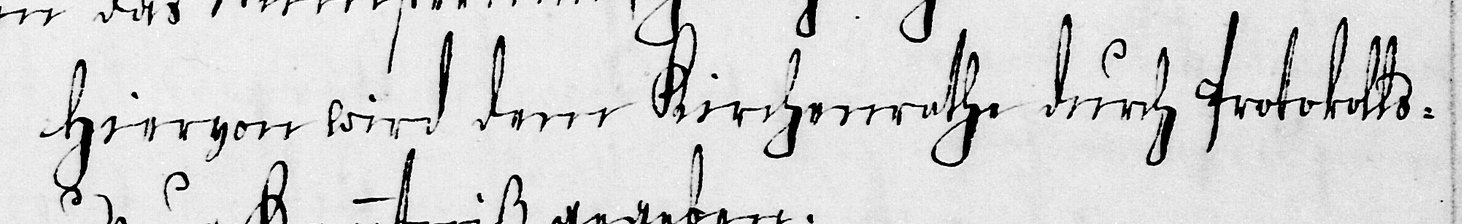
Hiervon wird dem Kirchenrathe durch Protokoll¬
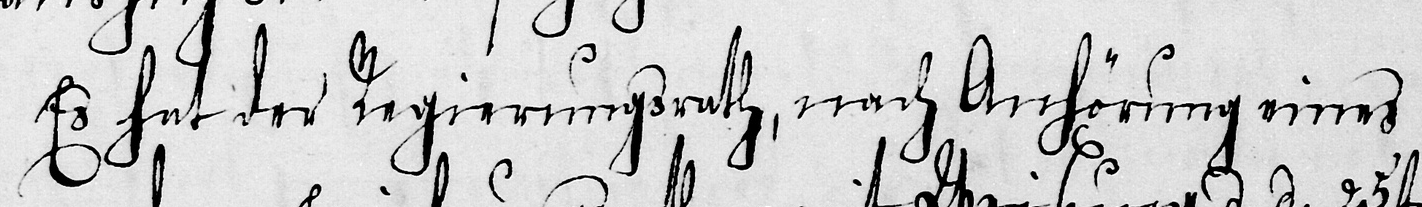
Es hat der Regierungsrath, nach Anhörung eines
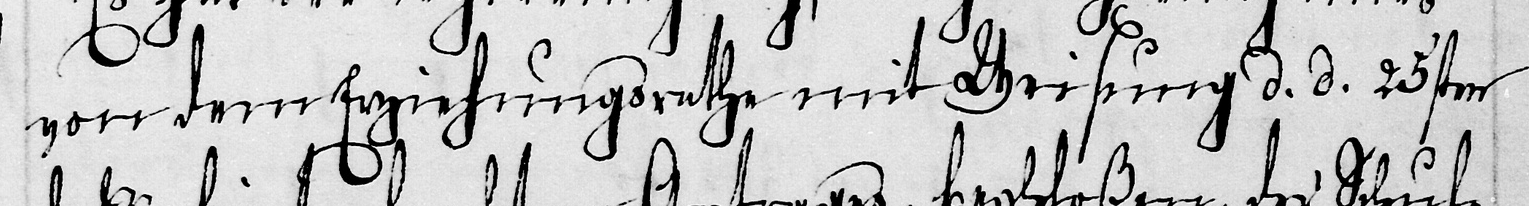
von dem Erziehungsrathe mit Weisung d. d. 25sten
